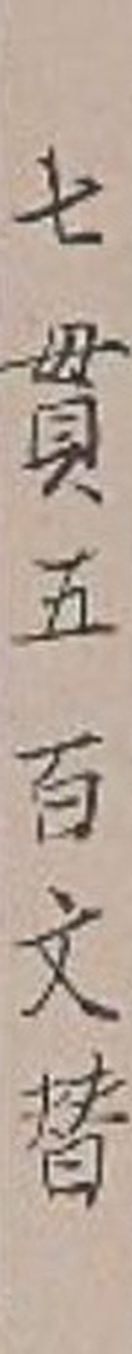七貫五百文替
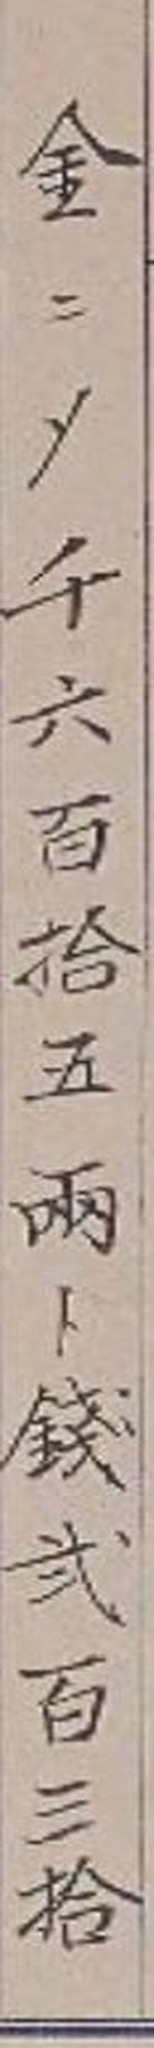金ニシテ千六百拾五兩ト錢弐百三拾
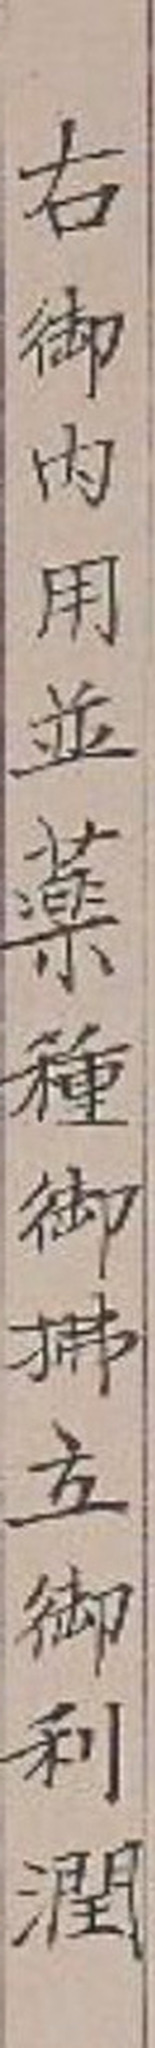右御内用並薬種御拂立御利潤
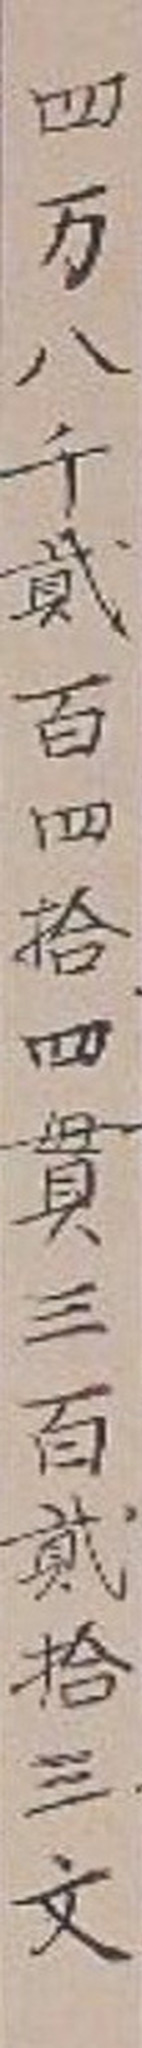四万八千貮百四拾四貫三百貮拾三文
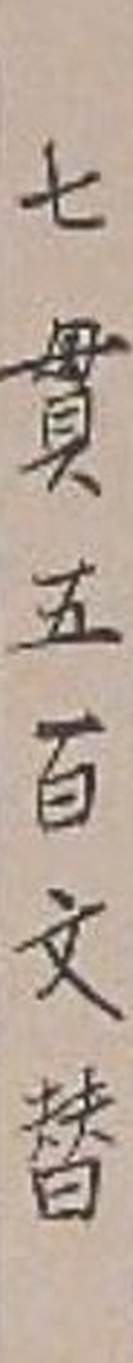七貫五百文替
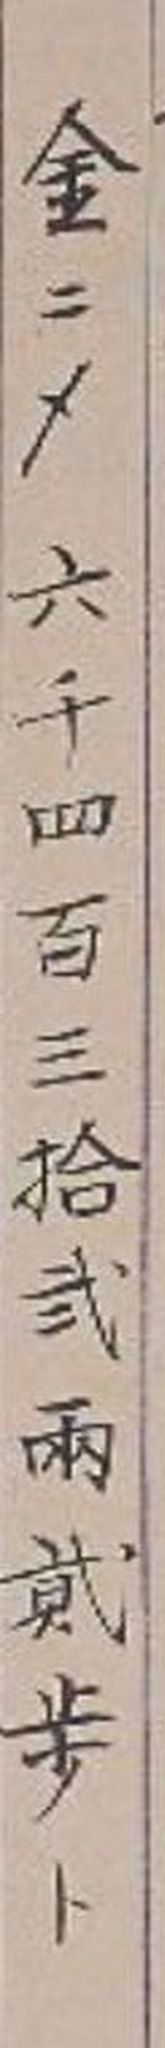金ニシテ六千四百三拾弐兩貮歩ト
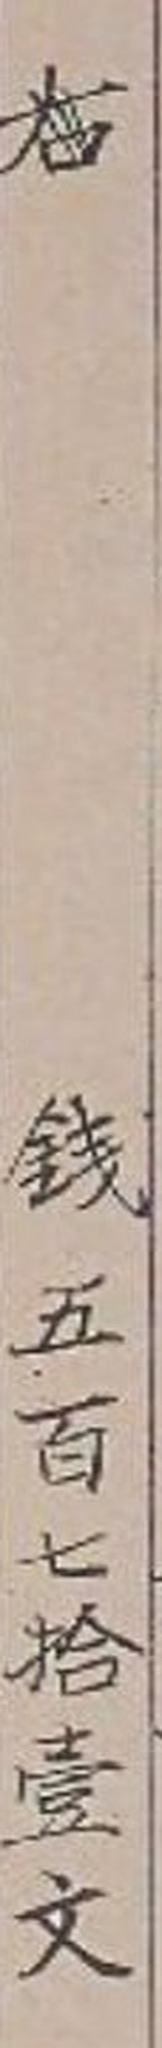右銭五百七拾壹文
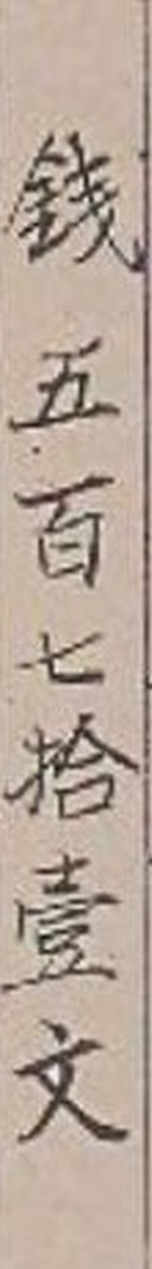右銭五百七拾壹文
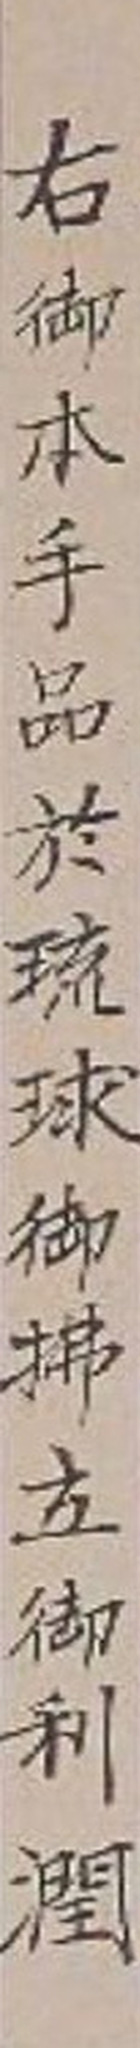右御本手品於琉球御拂立御利潤
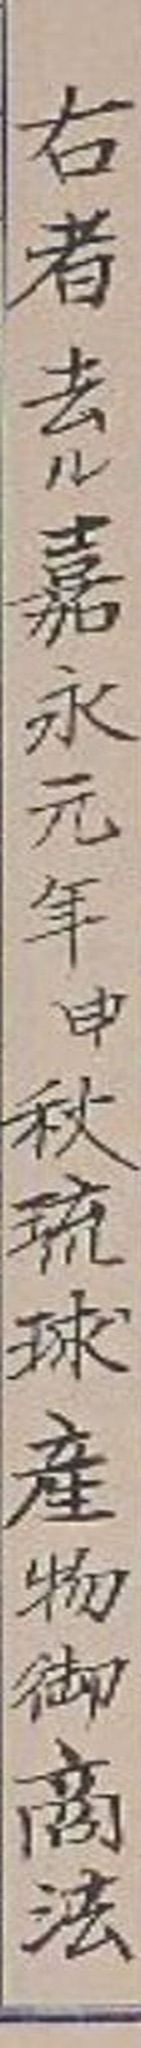右者去ル嘉永元年申秋琉球産物御商法
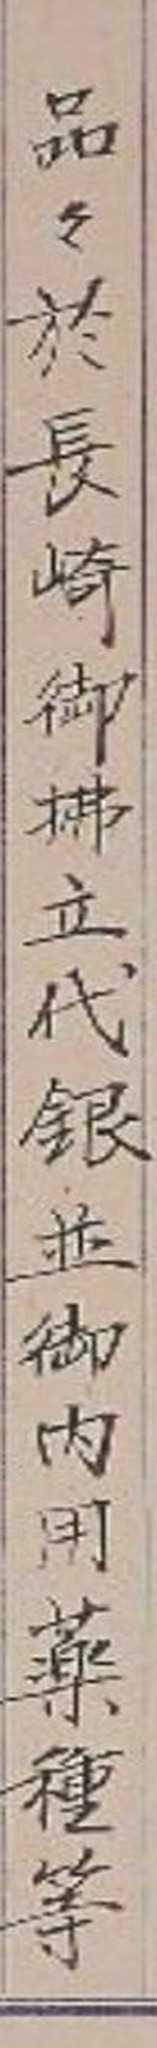品々於長崎御拂立代銀並御内用薬種等
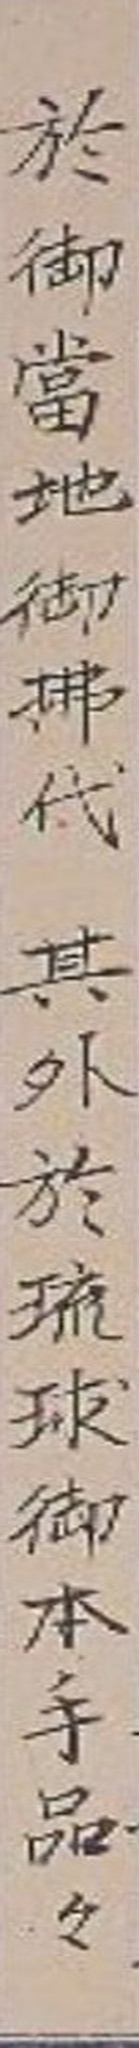於御當地御拂代其外於琉球御本手品々
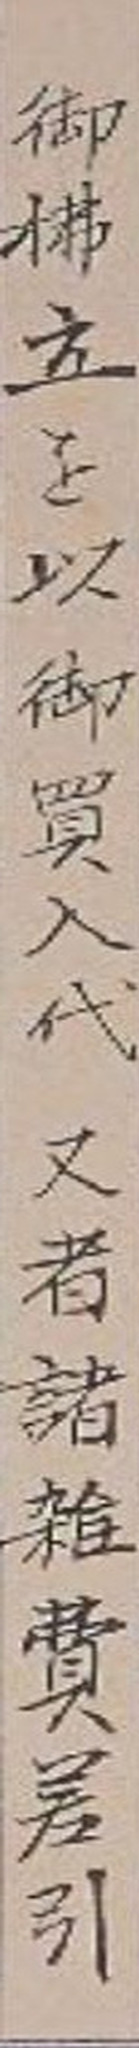御拂立を以御買入代又者諸雑費佐引
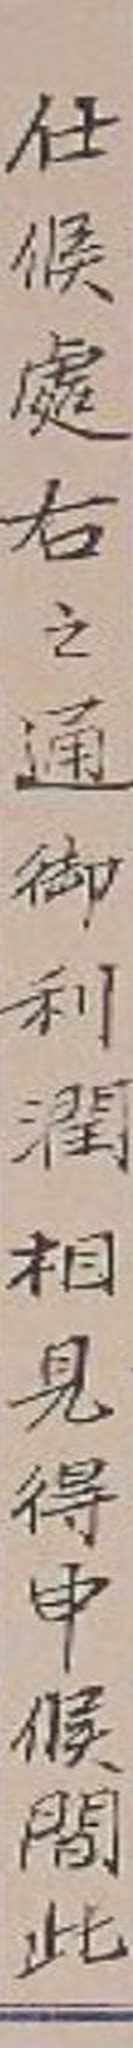仕候處右之通御利潤相見得申候間此
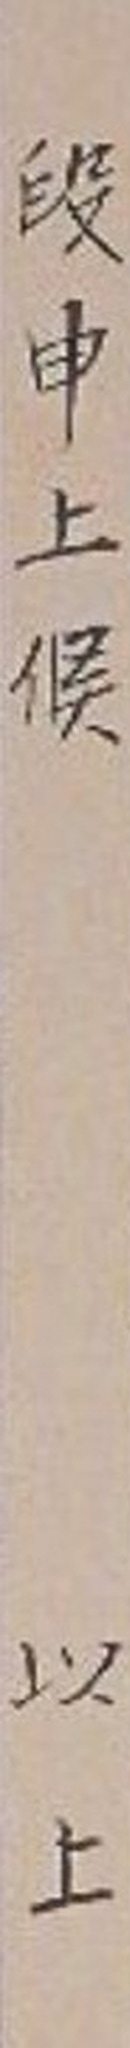段申上候以上
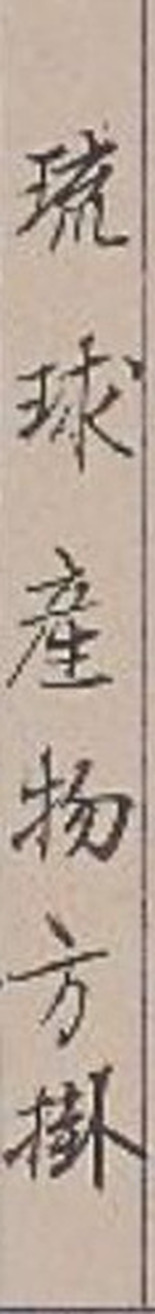琉球産物方掛
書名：琉球産物於長崎拂立並本手品利潤総帖 弘化四年より酉年迄
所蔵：University of the Ryukyus Library
